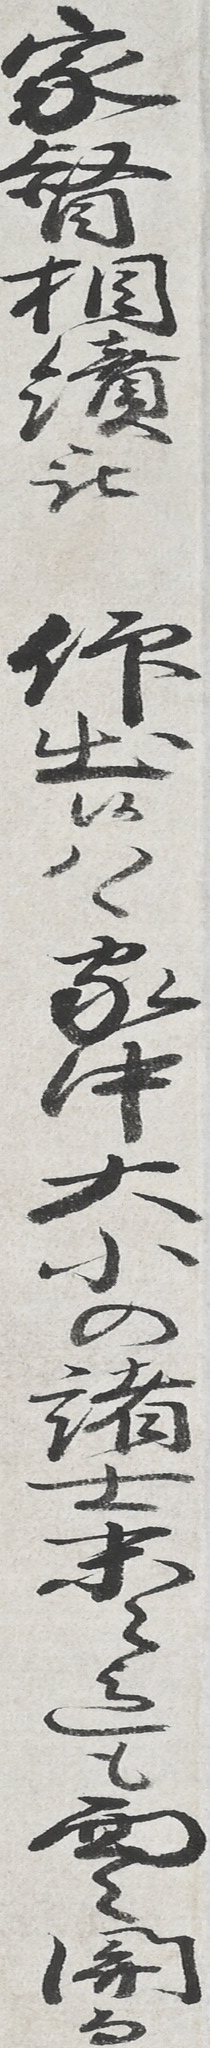家督相続被仰出候ハヽ家中大小の諸士末々迄も面々関る
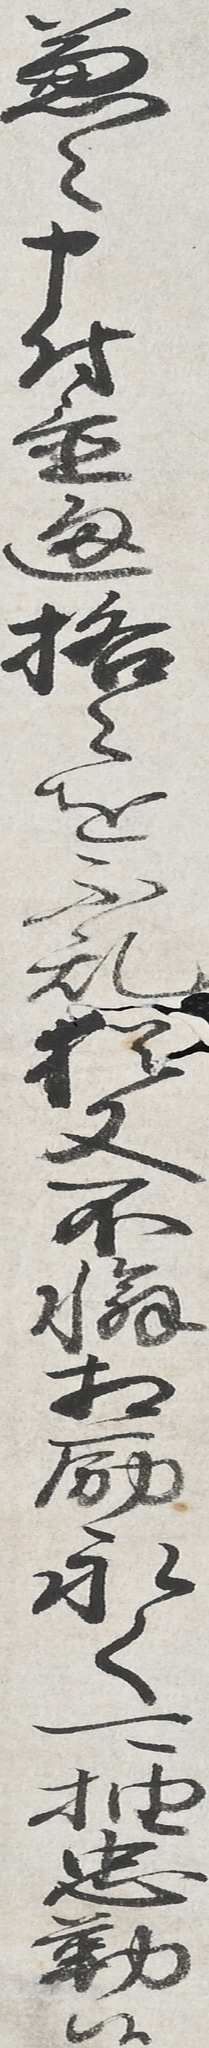兼々申付置通格々を不乱猶又不懈相励永く可抽忠勤候
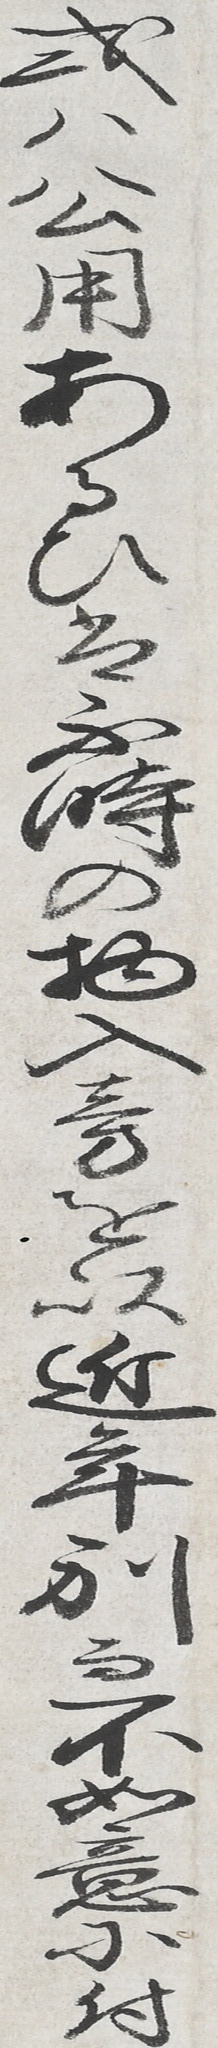或ハ公用あるひは不時の物入旁を以近年別而不如意に付
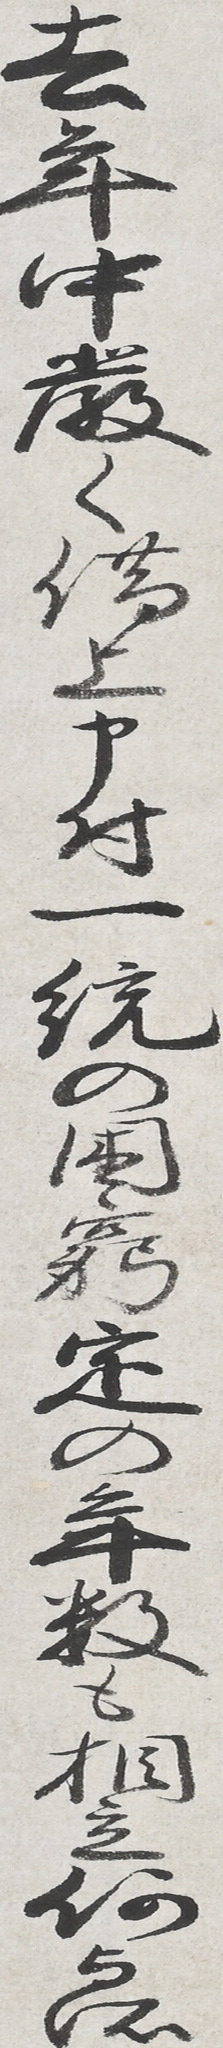去年中厳く借上申付一統の困窮定の年数も相立何とそ
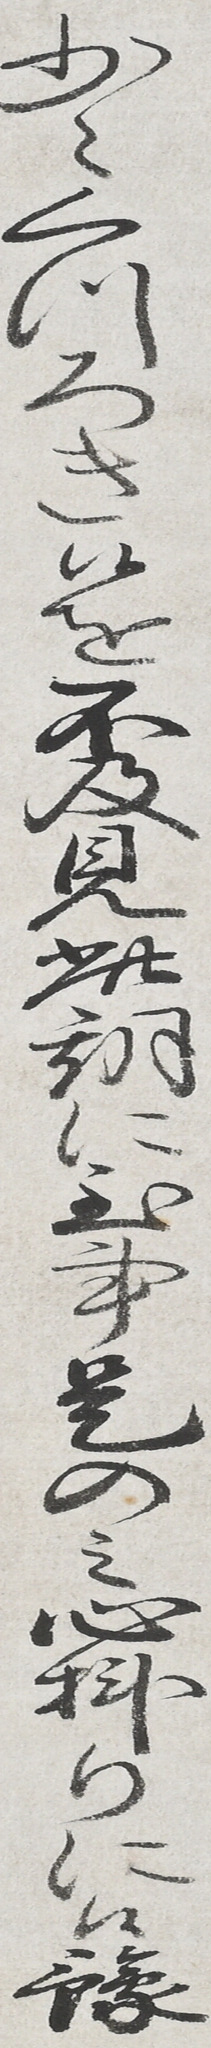少々くつろき候を不及見此期に至事是のミ心掛りに候予
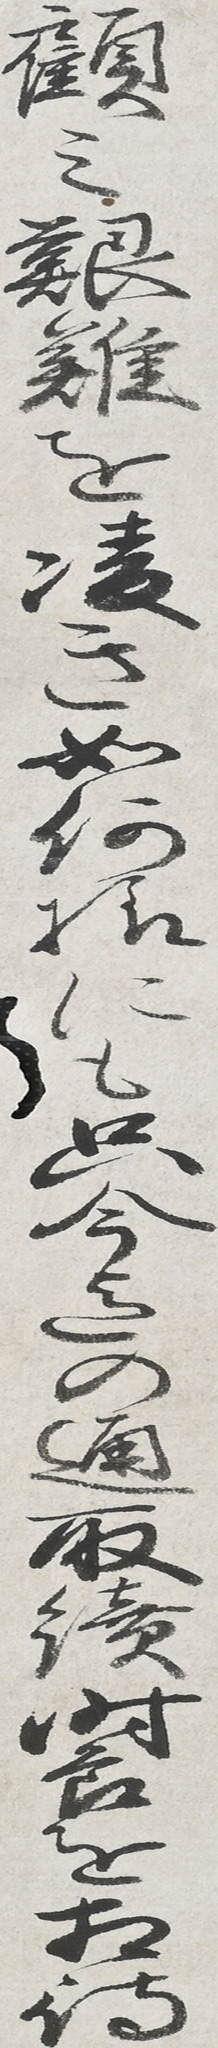顧ミ艱難を凌き如何様にも只今迄の通取続時節を相待
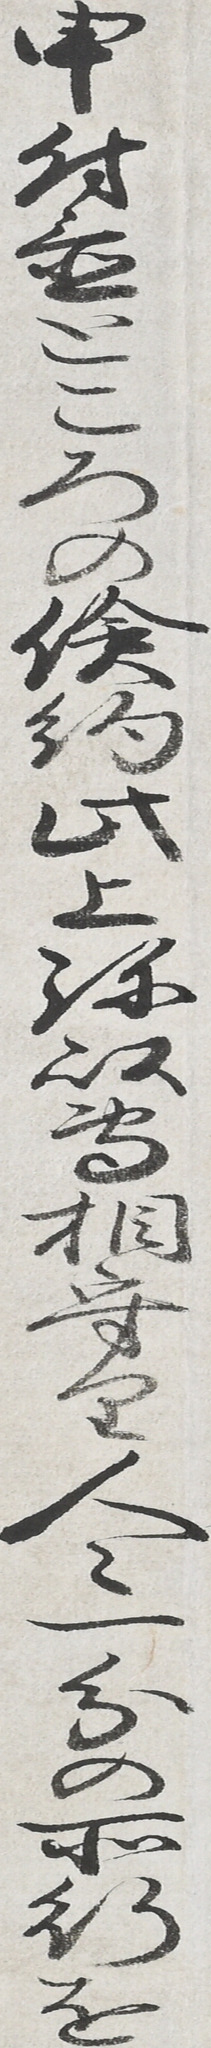申付置ところの倹約此上弥以専相守り人々一分の所行を
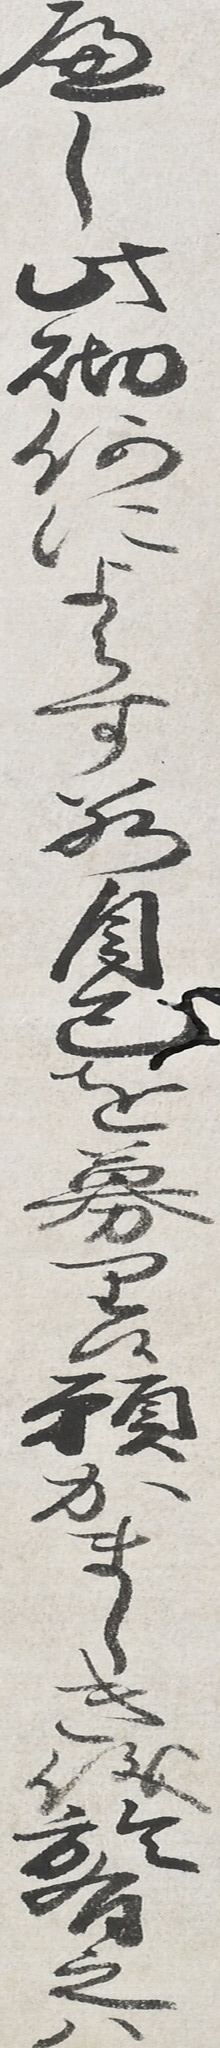へし此砌何によらす若自己を募り候願かましき儀於有之ハ
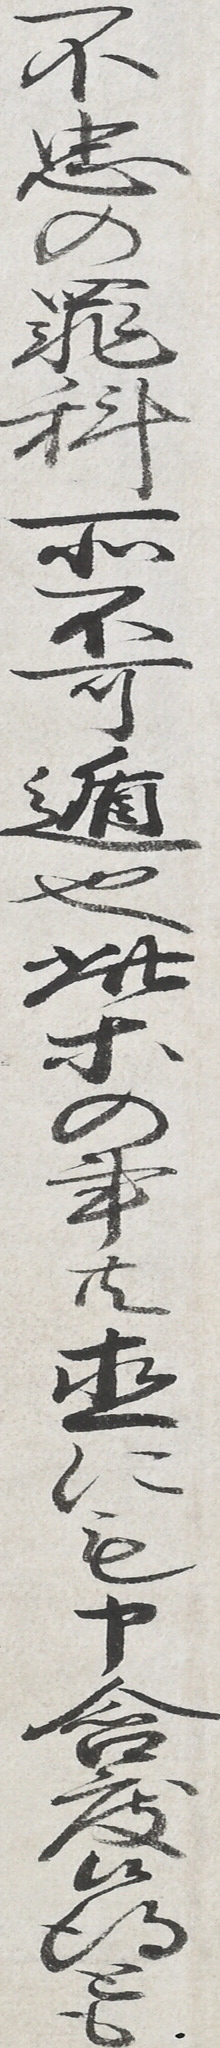不忠の罪科所不可遁也此等の事共直にも申含度候得とも
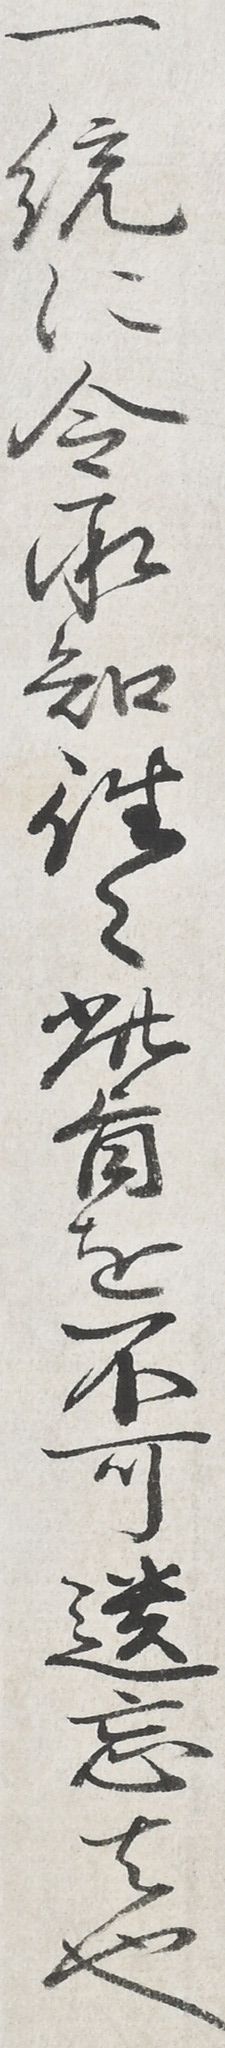一統に令承知往々此旨を不可遺忘者也
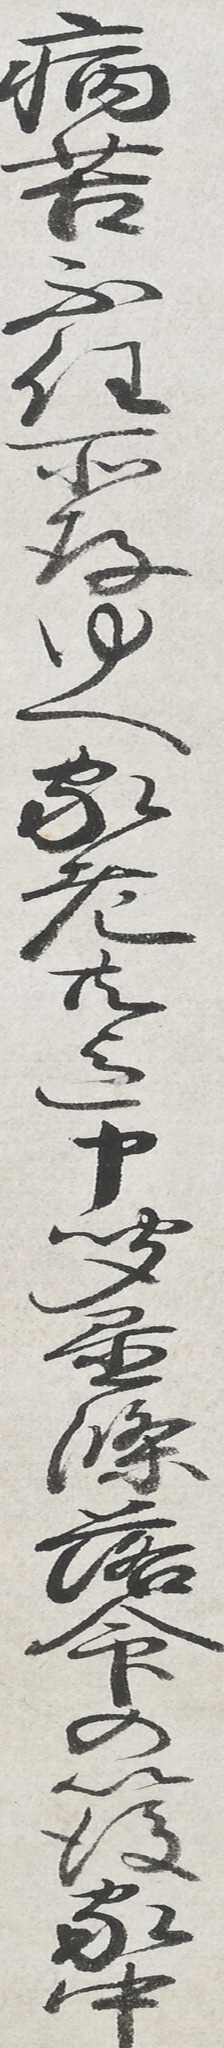病苦不任所存ゆへ家老共迄申聞置條落命の以後家中
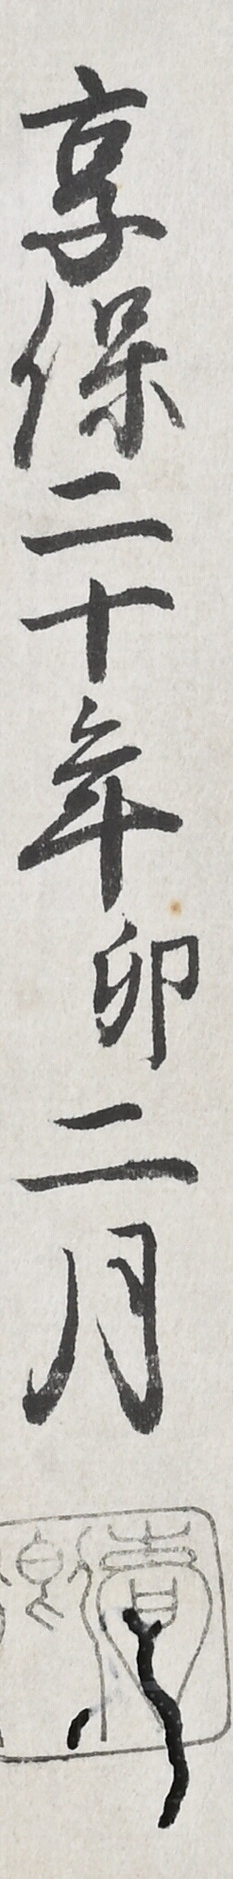享保二十年卯二月
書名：真如院様御遺言
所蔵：伊那市立高遠町図書館・合同会社AMANE
